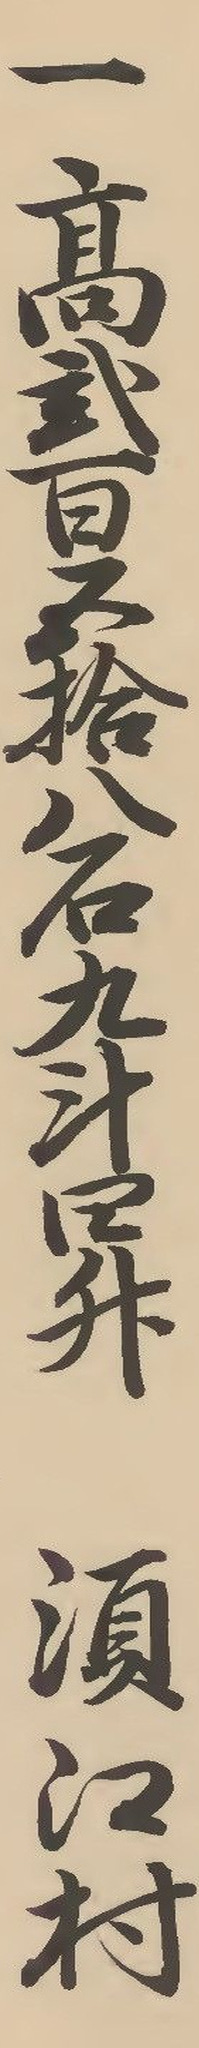一高弐百五拾八石九斗四升須江村
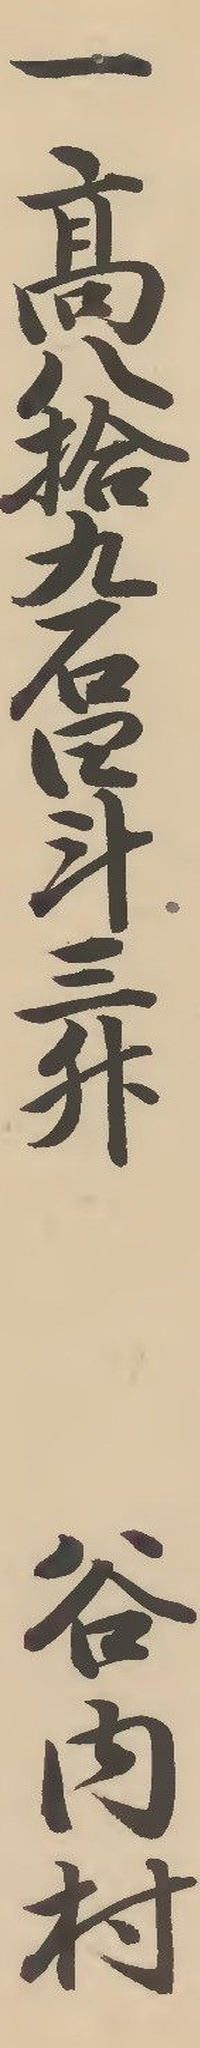一高八拾九石四斗三升谷内村

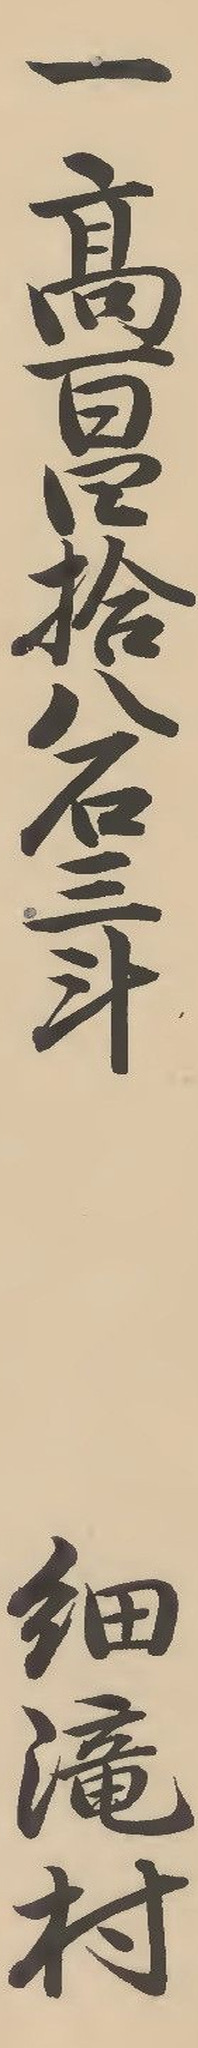一高百四拾八石三斗細滝村
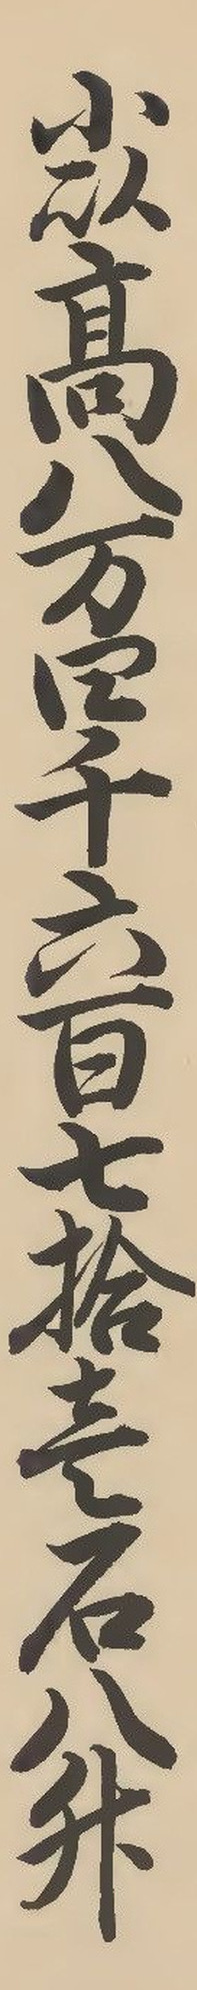小以高八万四千六百七拾壱石八升
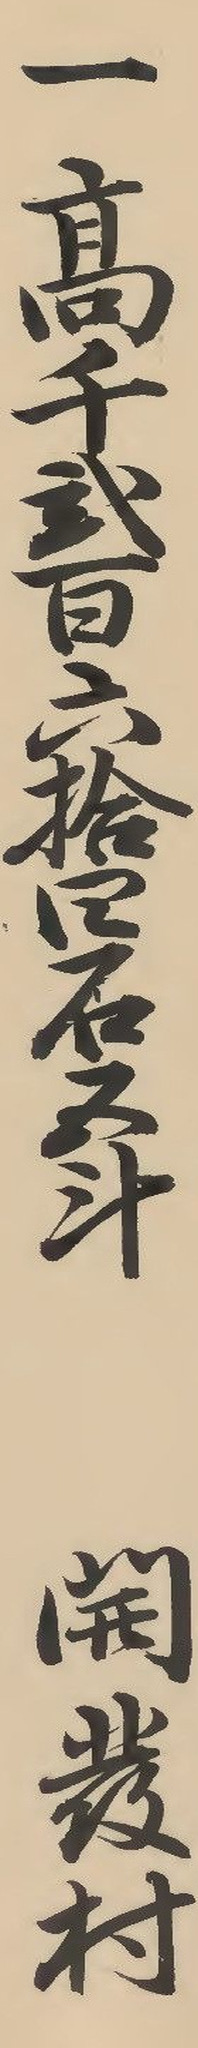一高千弐百六拾四石五斗開発村
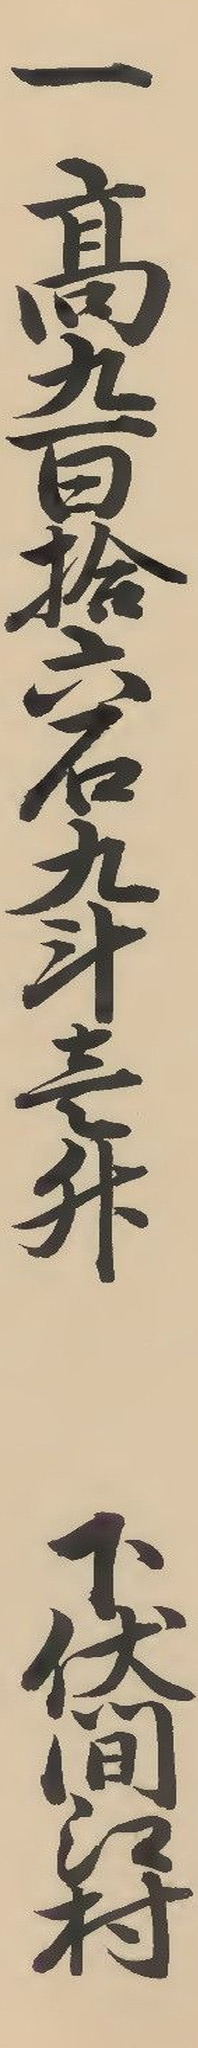一高九百拾六石九斗壱升下伏間江村
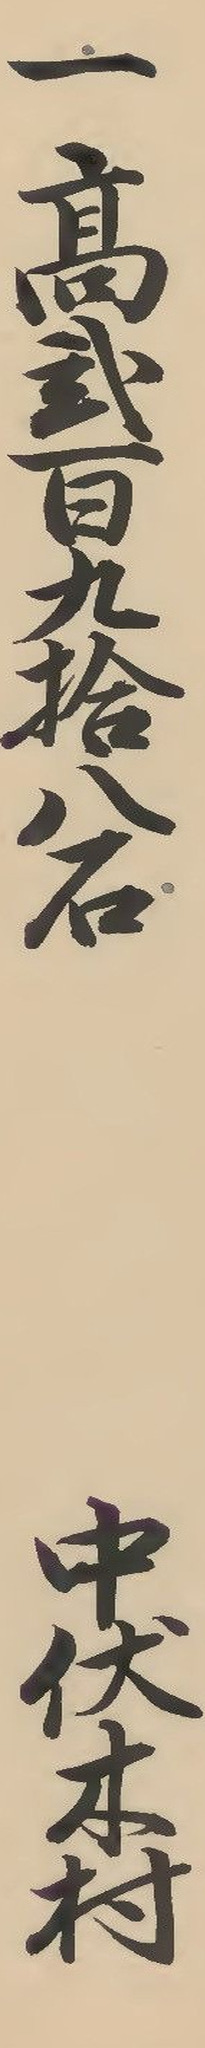一高弐百九拾八石中伏木村

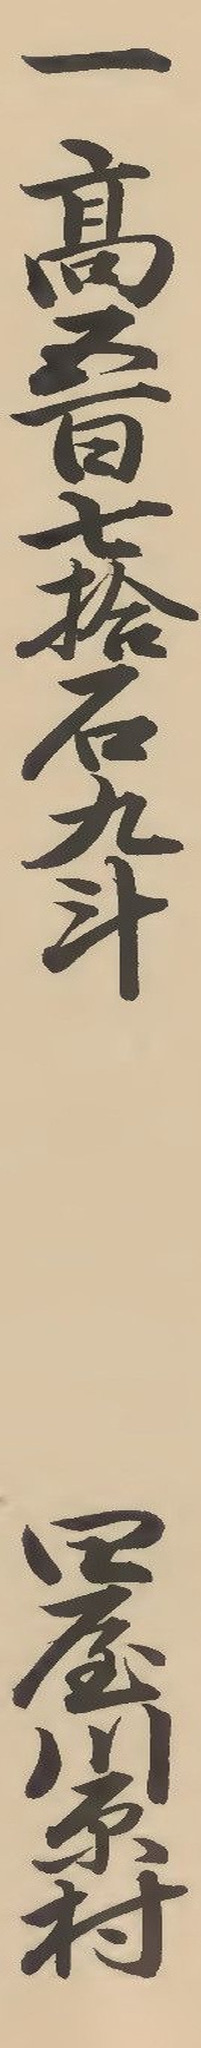一高五百七拾石九斗四屋川原村
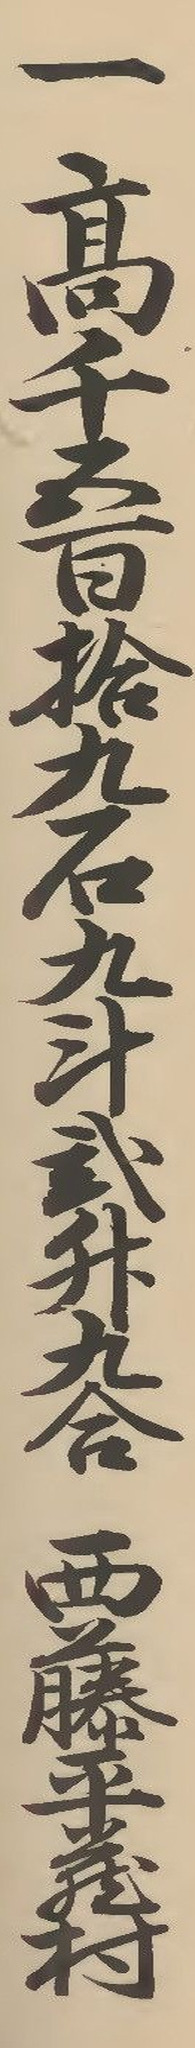一高千五百拾九石九斗弐升九合西藤平蔵村
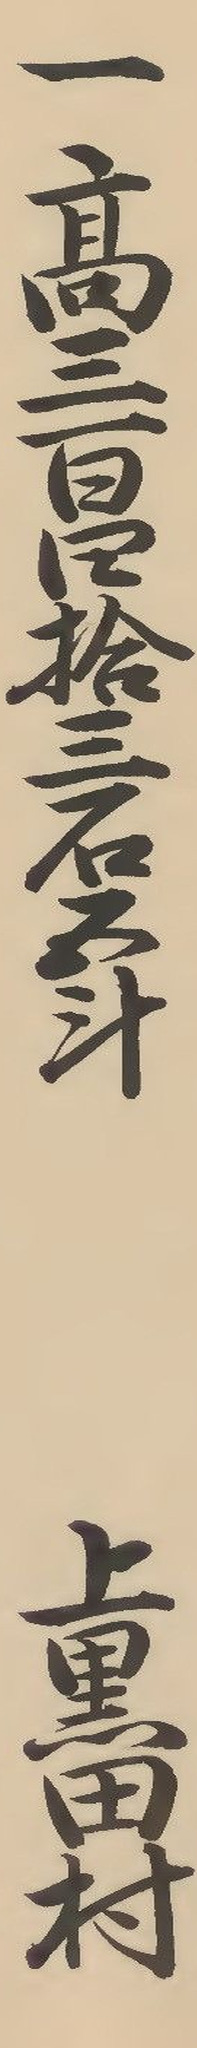一高三百四拾三石五斗上黒田村
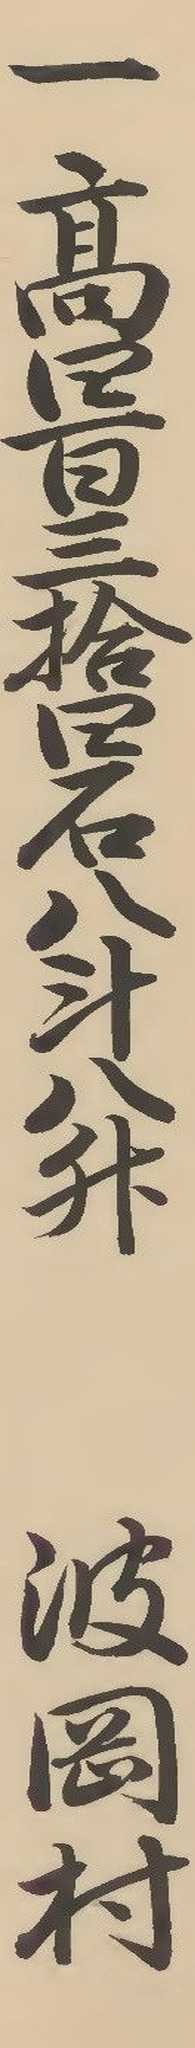一高四百三拾四石八斗八升波岡村

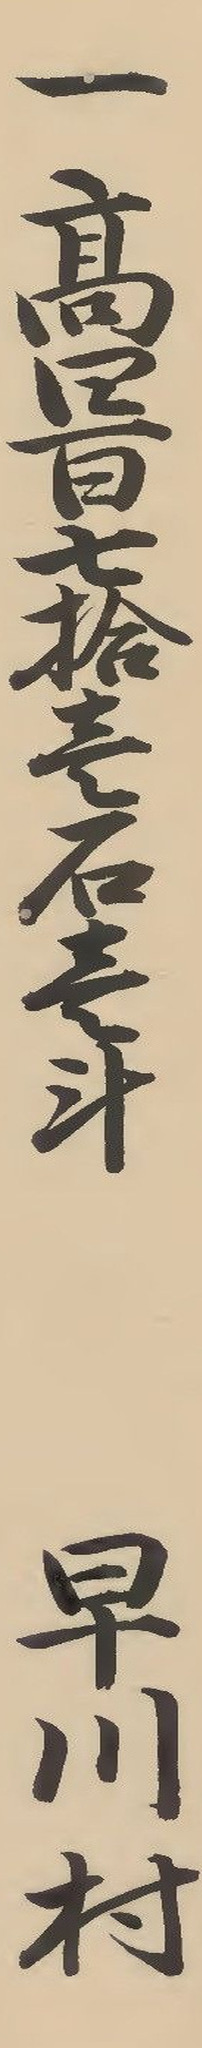一高四百七拾壱石壱斗早川村
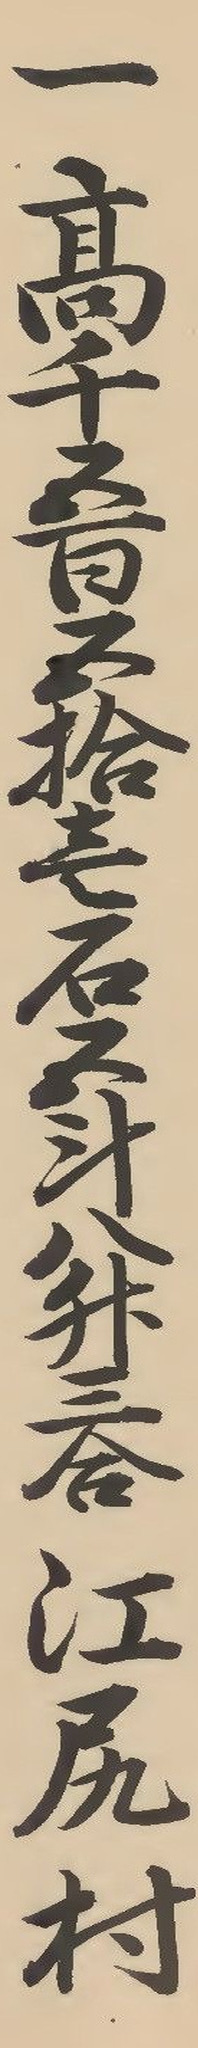一高千五百五拾壱石五斗八升三合江尻村
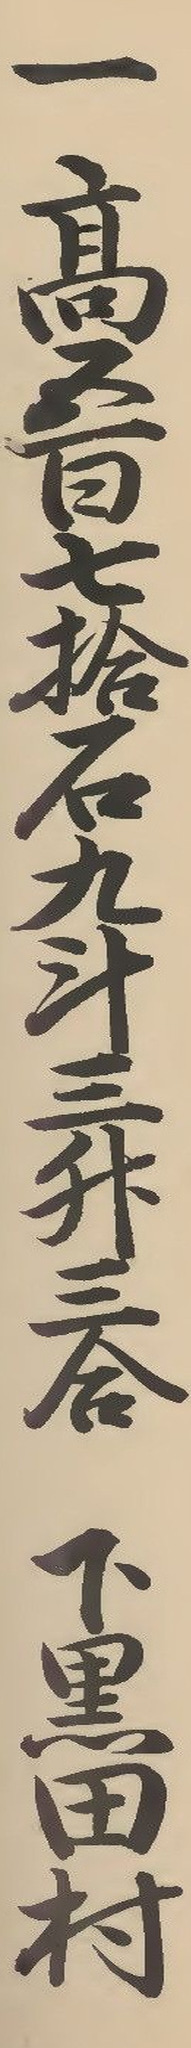一高五百七拾石九斗三升三合下黒田村
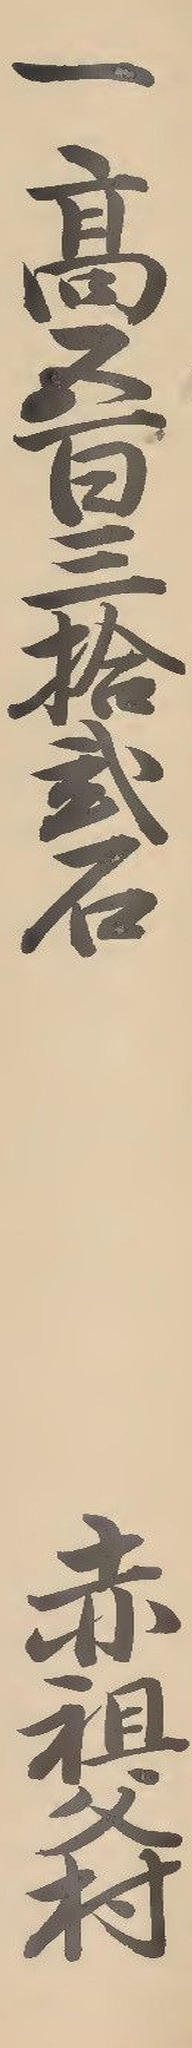一高五百三拾弐石赤祖父村
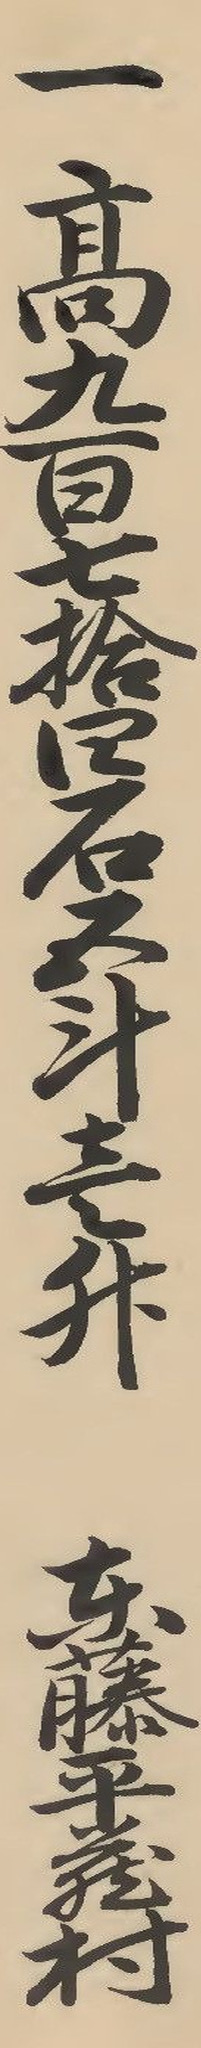一高九百七拾四石五斗壱升東藤平蔵村
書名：越中国郷帳
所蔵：国立公文書館 National Archives of Japan
